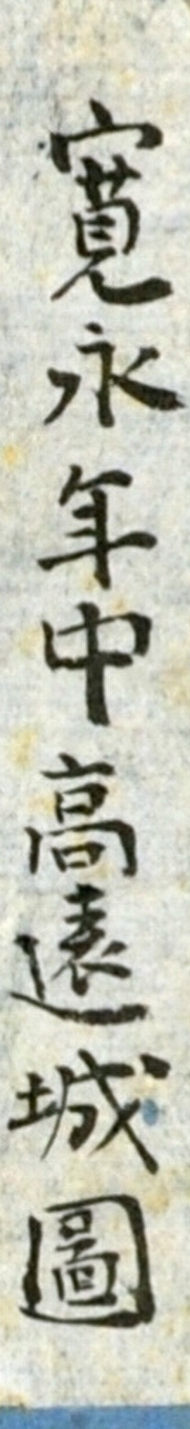寛永年中高遠城図
